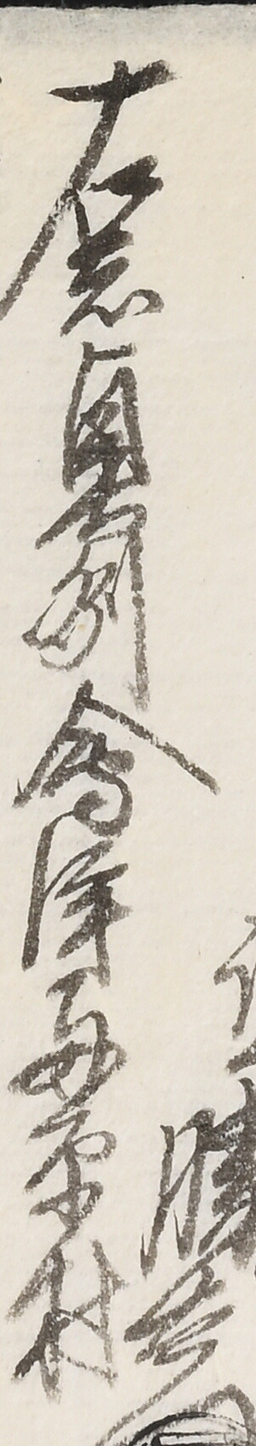右者奥州会津両原村
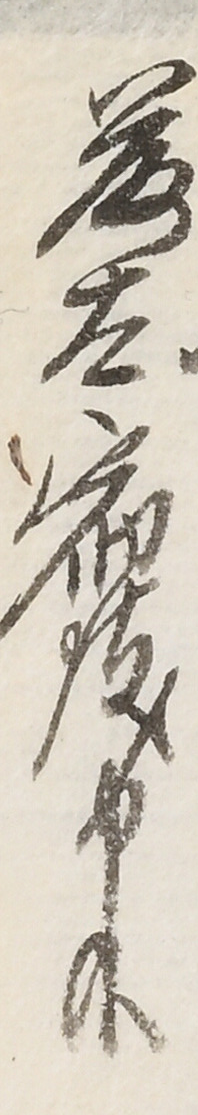藤太宿致申候
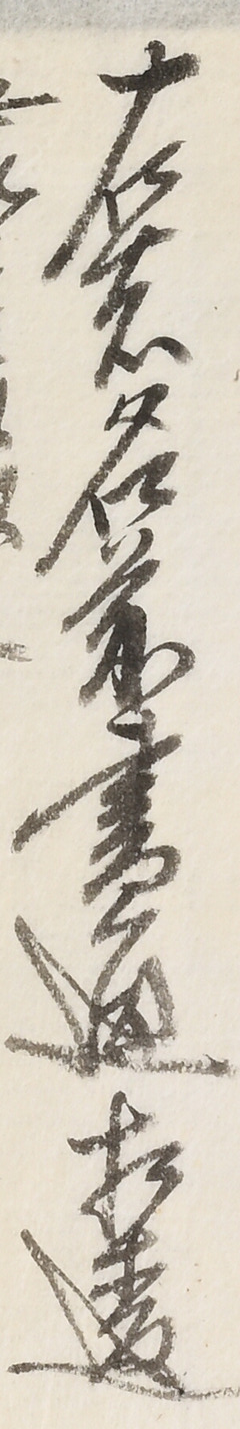右者名前書通相違
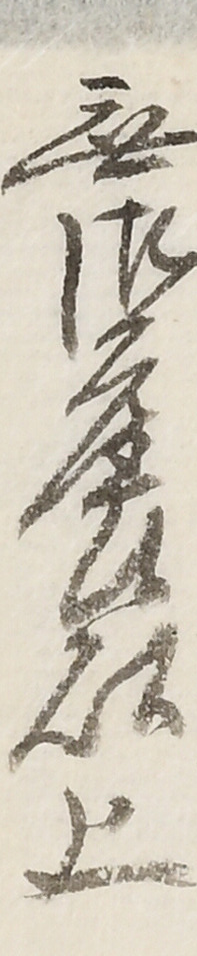無御座候以上
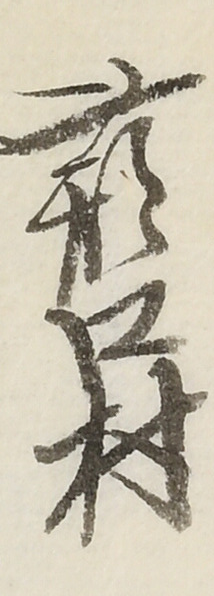荊口村
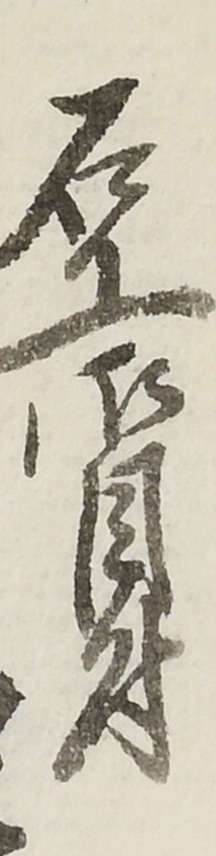石工御目付
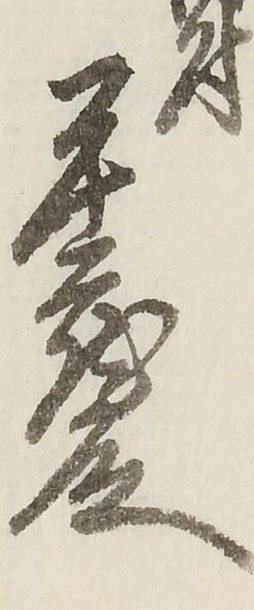平蔵殿
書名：文久二壬戌年正月石切名前書帳
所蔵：伊那市立高遠町図書館・合同会社AMANE
